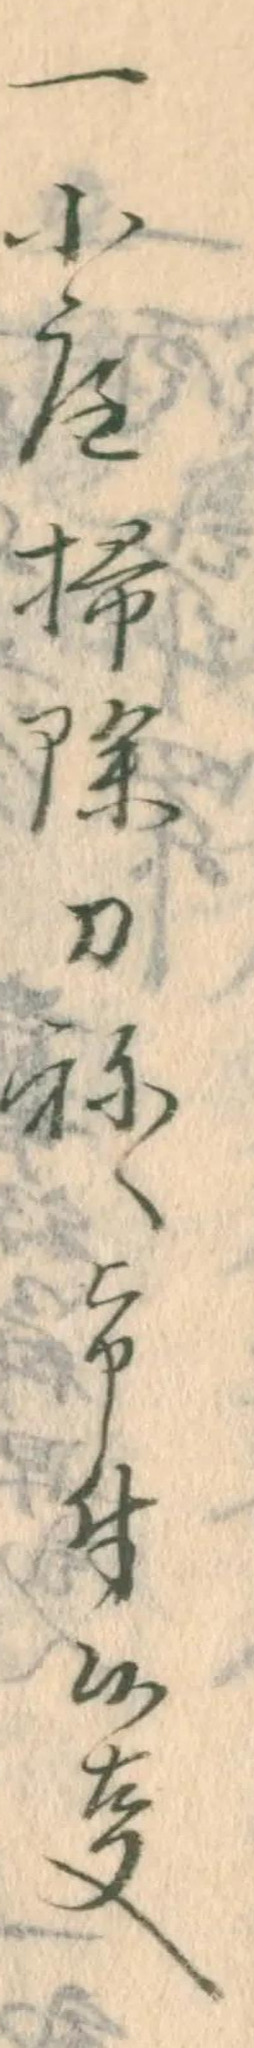一小屋掃除刀祢へ被申付候事
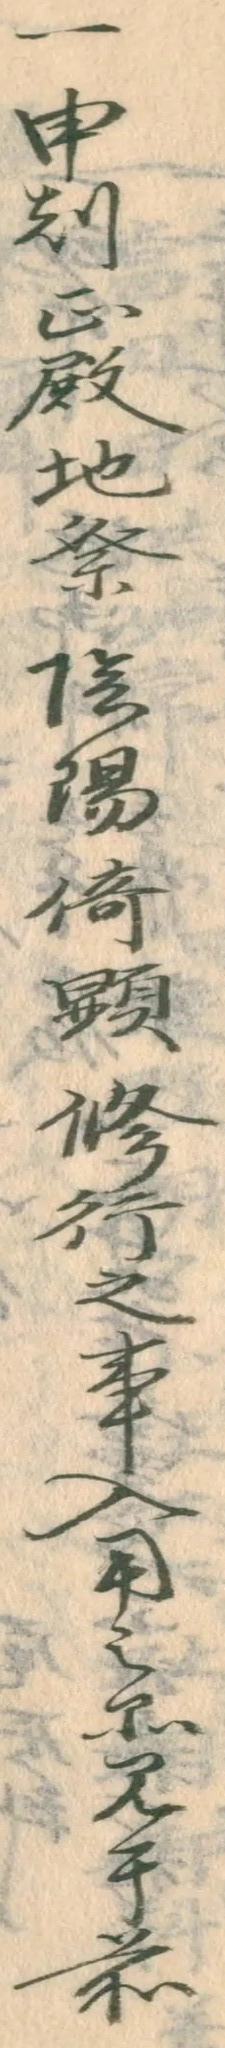一申刻正殿地祭陰陽倚顕修行之事入用之品見于前
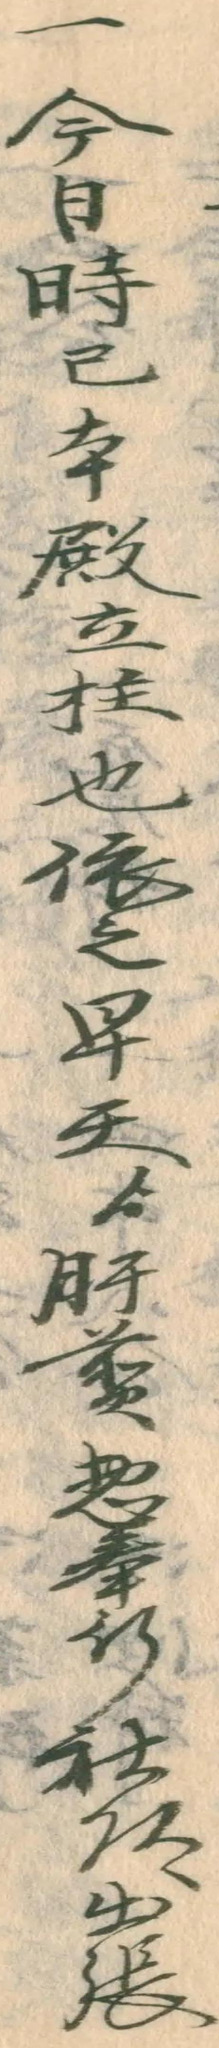一今日時巳本殿立柱也依之早天ゟ肝煎惣奉行社頭へ出張
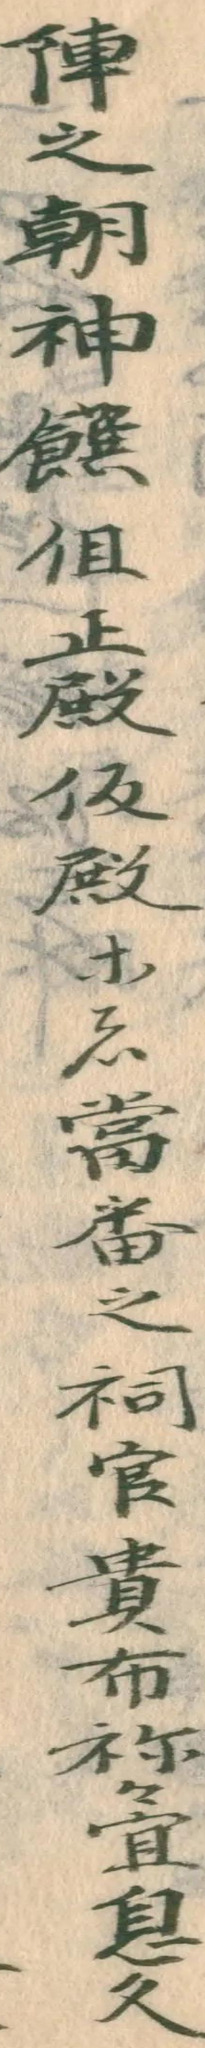陣之朝神饌但正殿仮殿等は当番之祠官貴布祢々宜息久
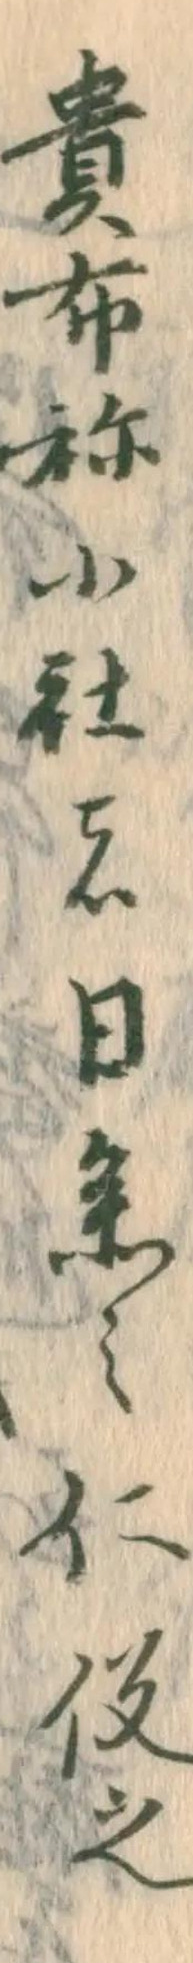貴布祢小社は日参之仁役之
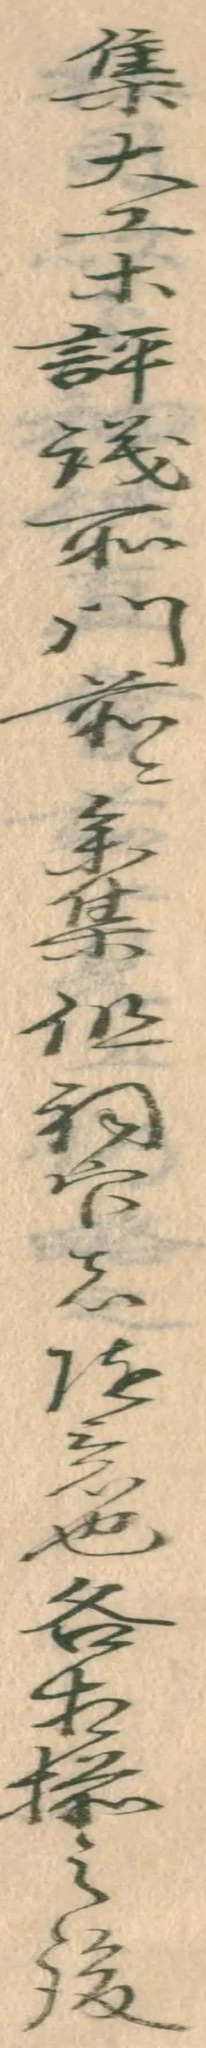集大工等評議所門前ニ参集但祠官は随意也各相揃之後
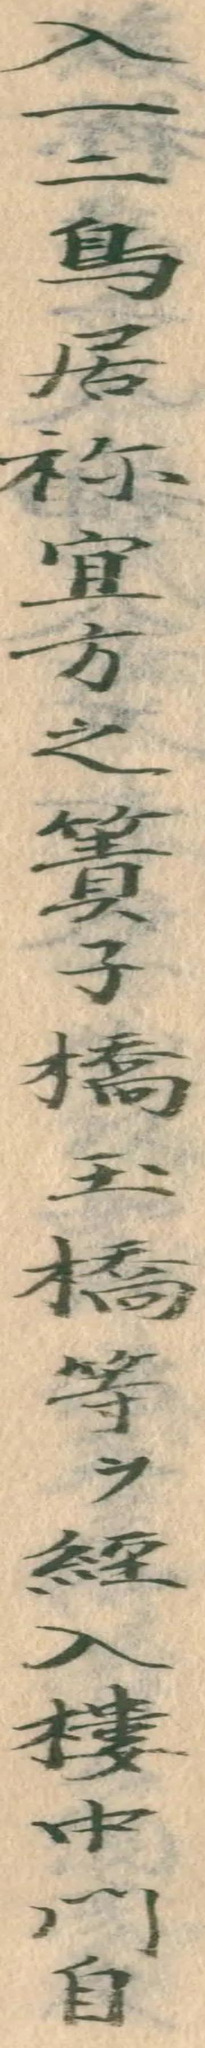入一二鳥居祢宜方之簀子橋玉橋等ヲ経入楼中門自
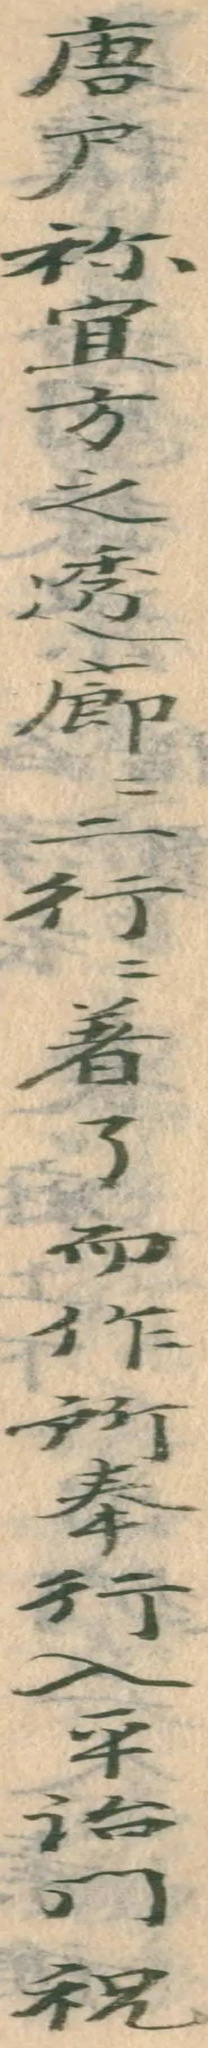唐戸祢宜方之透廊ニ二行ニ着了而作所奉行入平治門祝
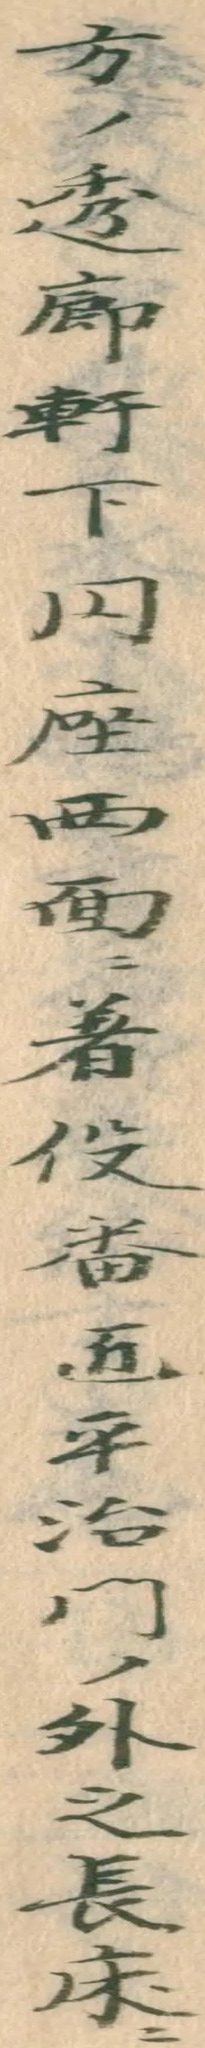方ノ透廊軒下円座西面ニ著役番匠平治門ノ外之長床ニ
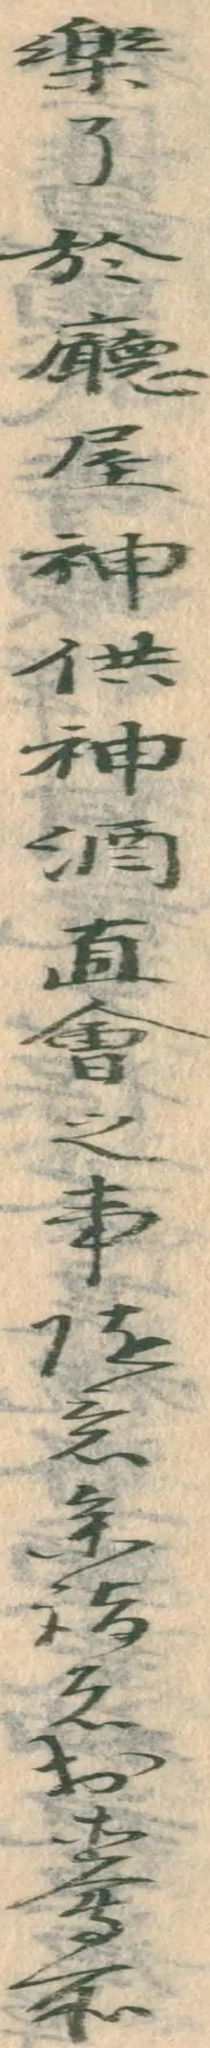楽了於庁屋神供神酒直会之事随意参詣は於直会所
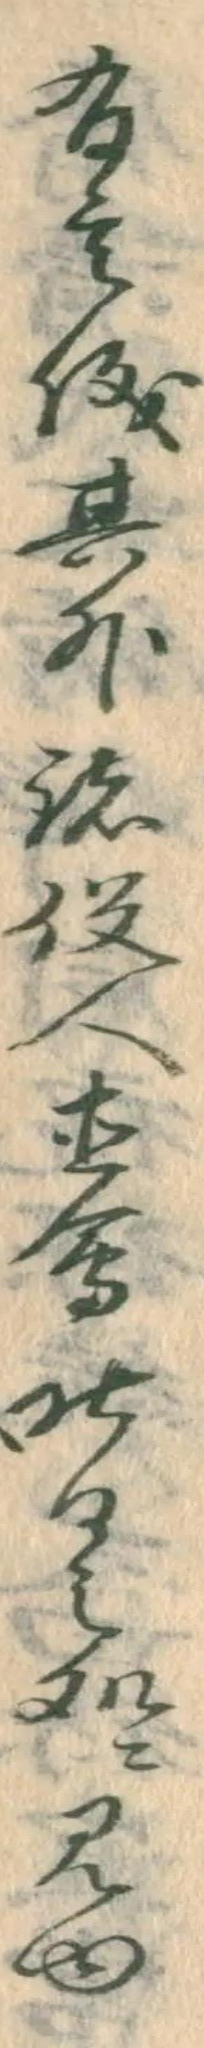有之儀其外諸役人直会昨日之処ニ見ゆ
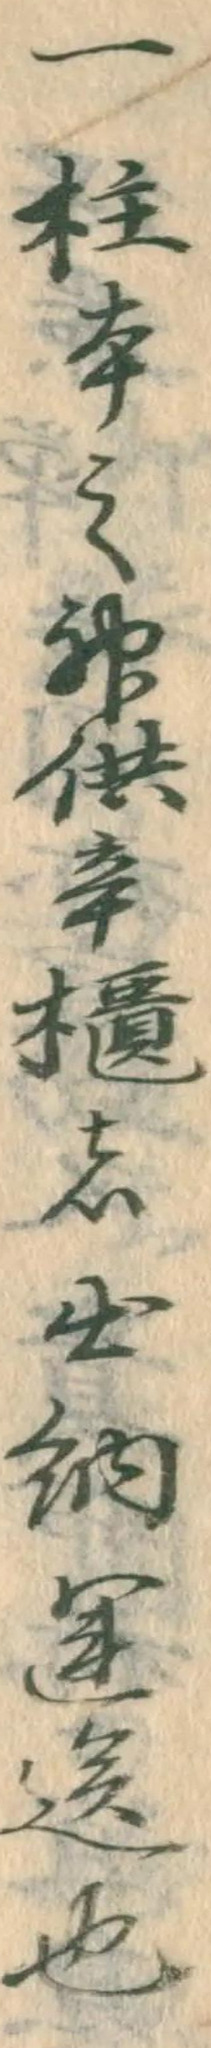一柱本之神供辛櫃は出納運送也
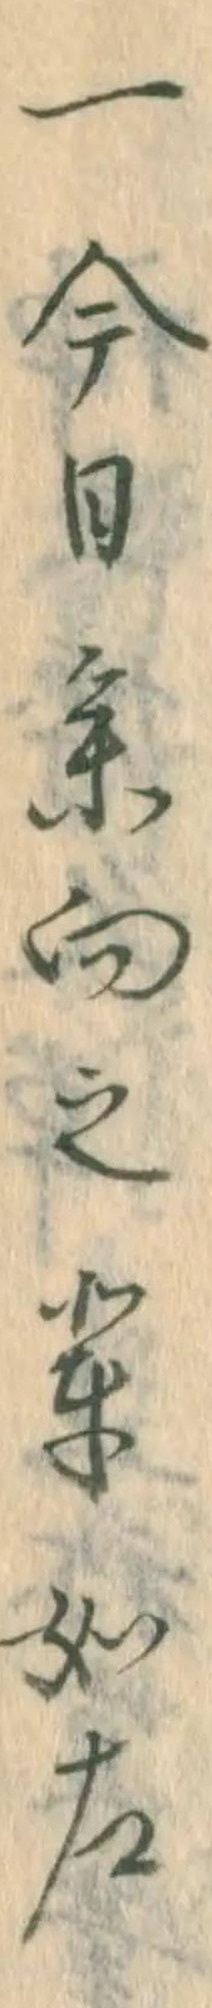一今日参向之輩如左

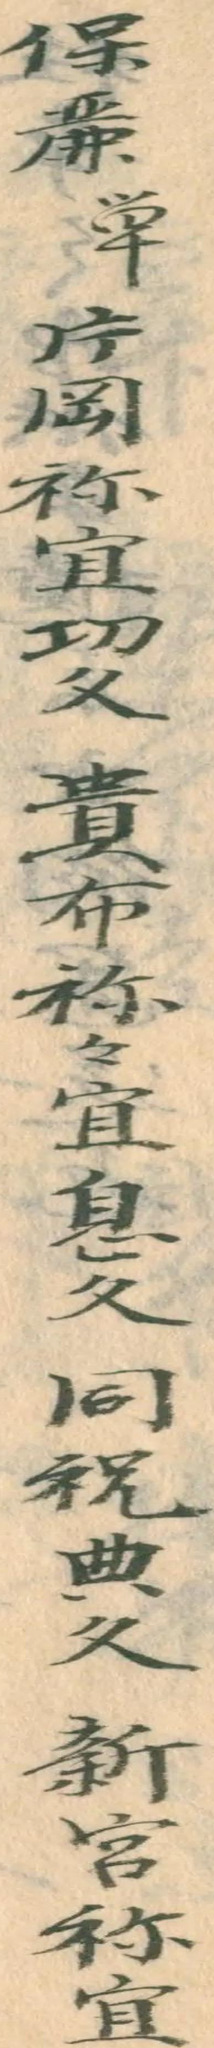保麗単片岡祢宜功久貴布祢々宜息久同祝典久新宮祢宜
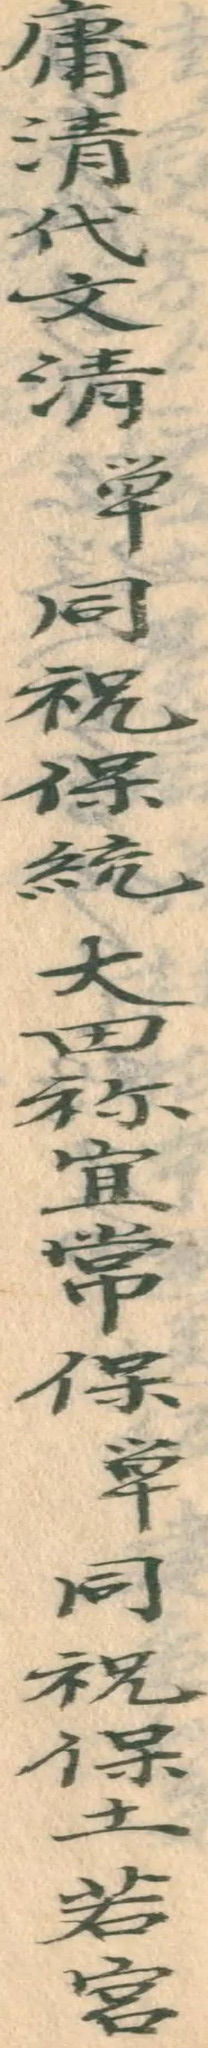庸清代文清単同祝保統大田祢宜常保単同祝保土若宮
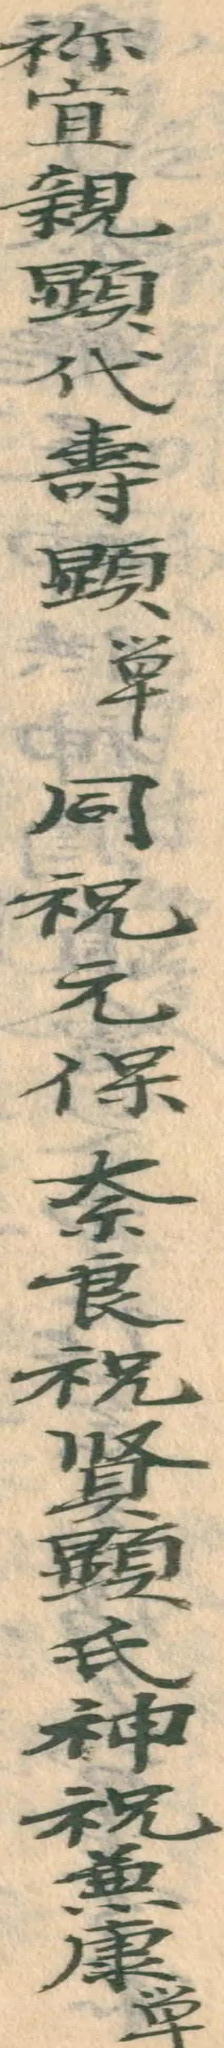祢宜親顕代寿顕単同祝元保奈良祝賢顕氏神祝兼康単
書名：賀茂社記録. 第17冊
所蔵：国立国会図書館 National Diet Library, JAPAN
